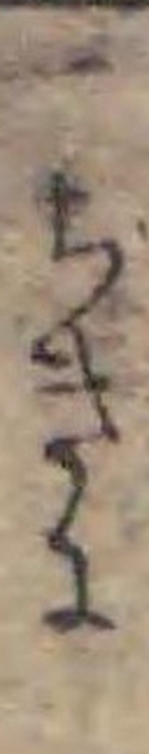ぢきに
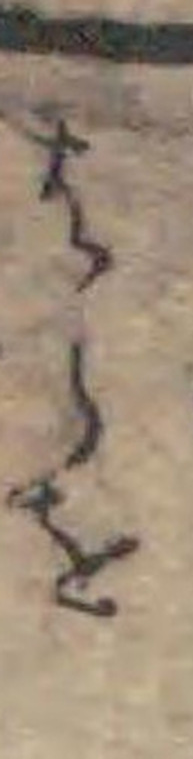はらを
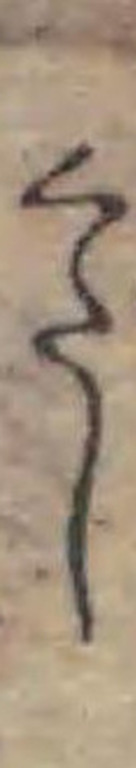くだし
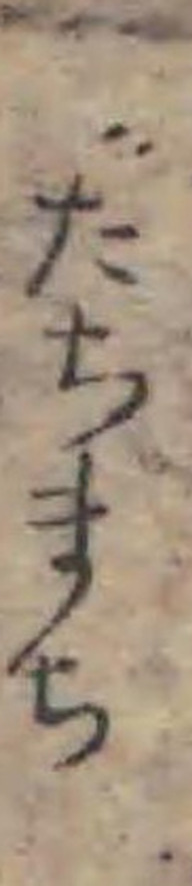たちまち
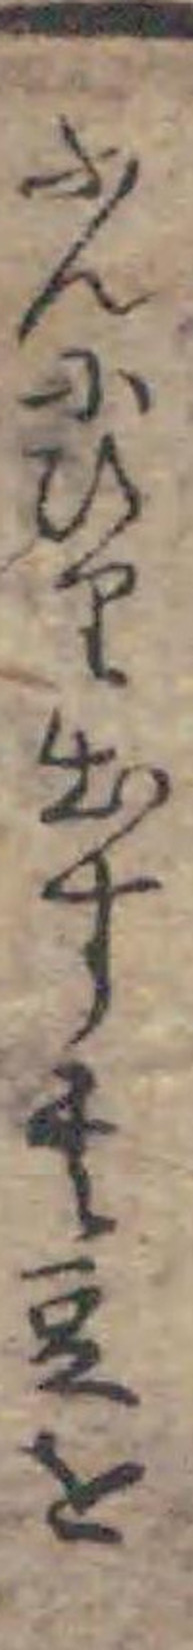ふんにひり出す其豆を
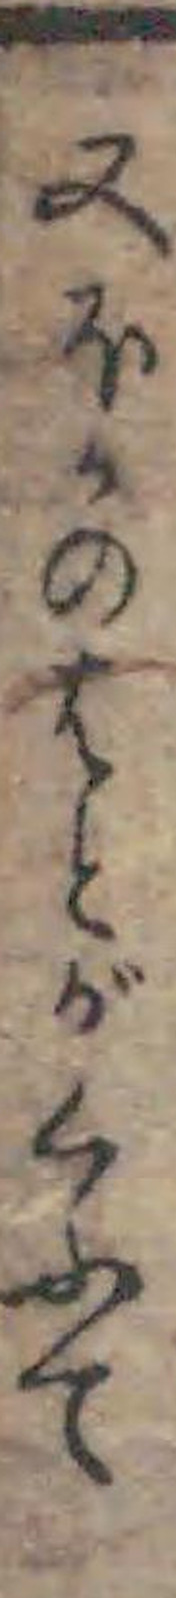又ほかのはとがくふて
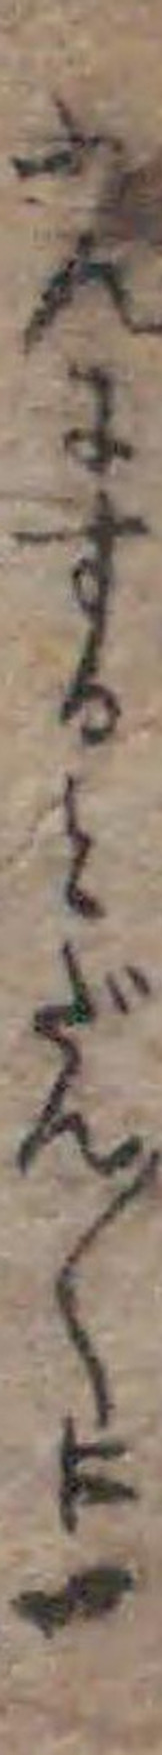ふんにするとだん〳〵に
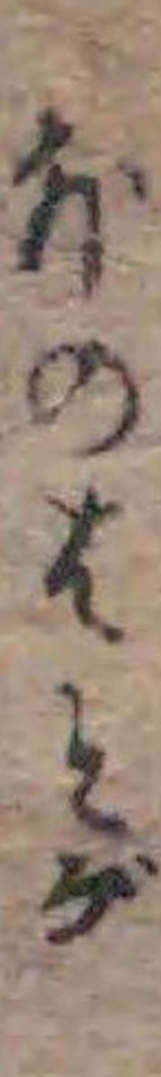外のはとが
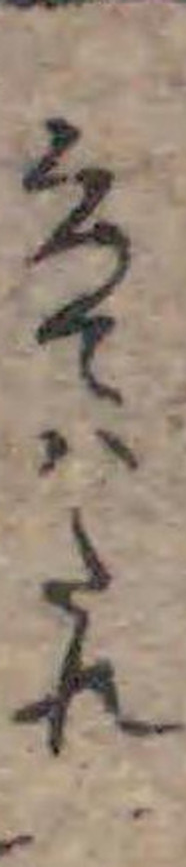くつてはたれ
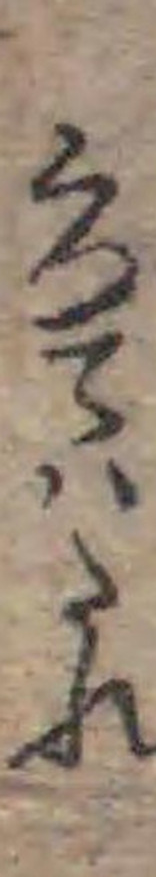くつてはたれ
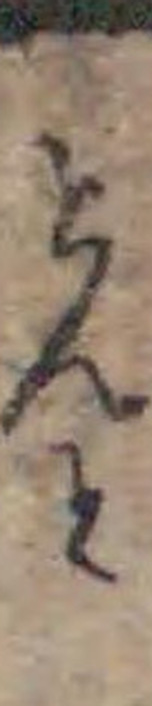とんと
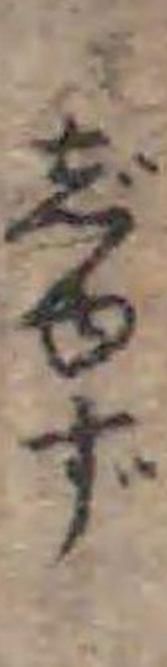じゆず
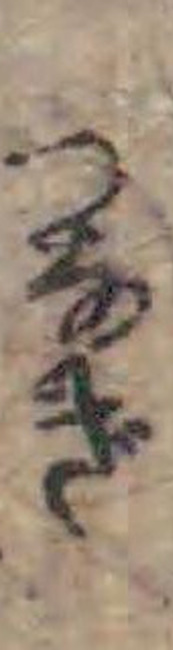つなぎ
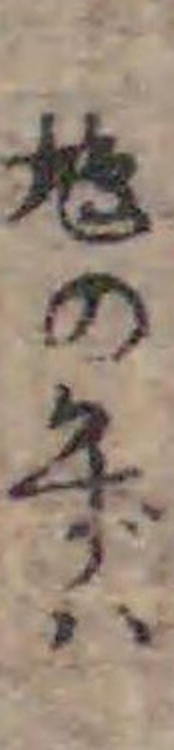鳩のかずは
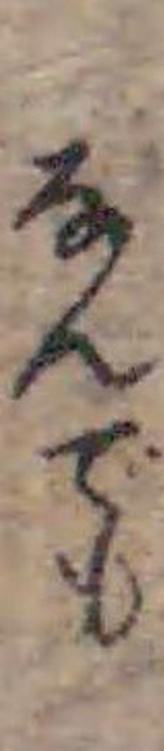なんでも
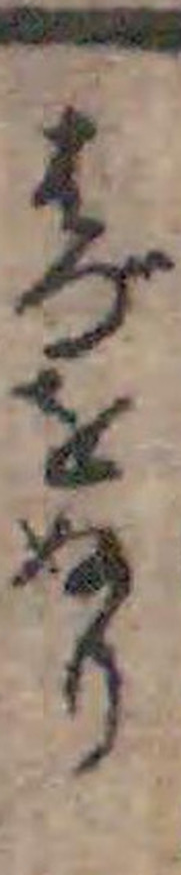はづをぬり
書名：虚言八百万八伝 : 3巻
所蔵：国立国会図書館 National Diet Library, JAPAN
